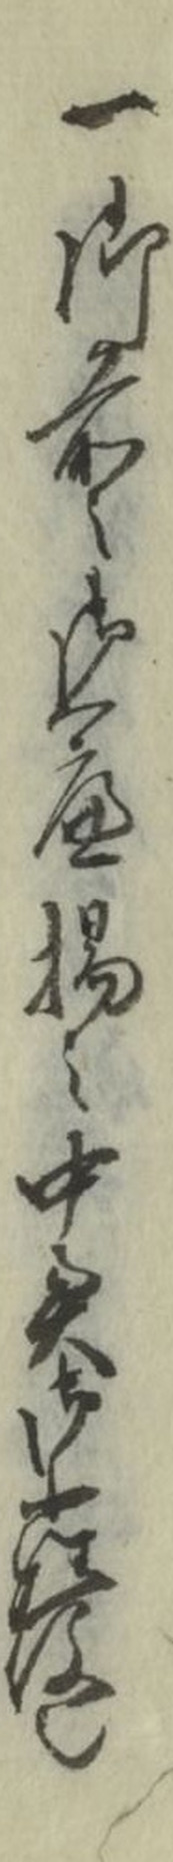一御前之御簾揚之中奥御小姓役之
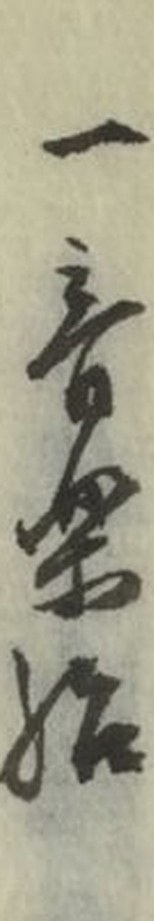一音楽始
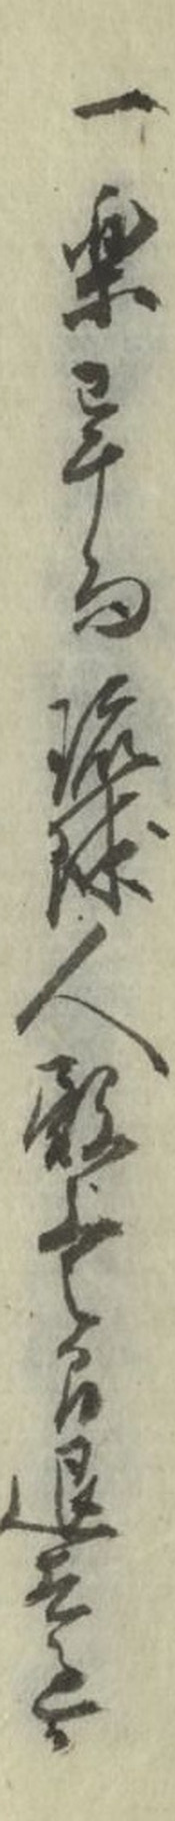一楽畢而琉球人殿上之間退去過而
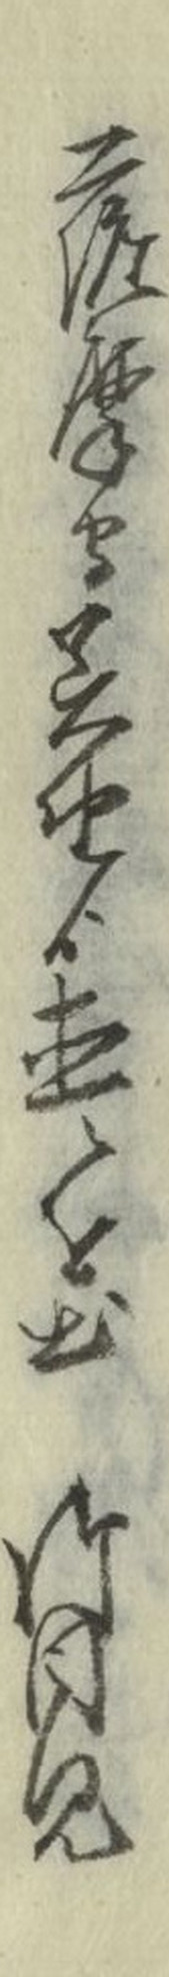薩摩守着坐ゟ直に進出御目見

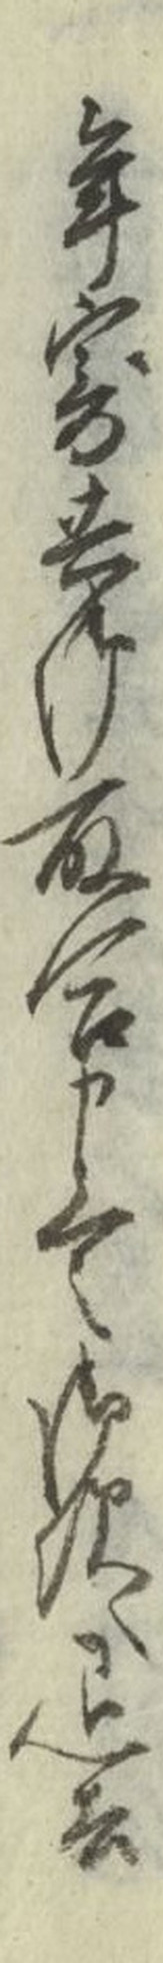年寄共御取合申上之御次へ退去
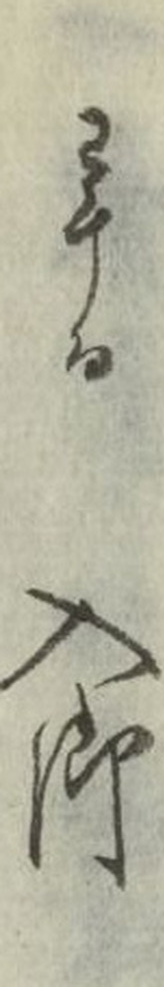畢而入御
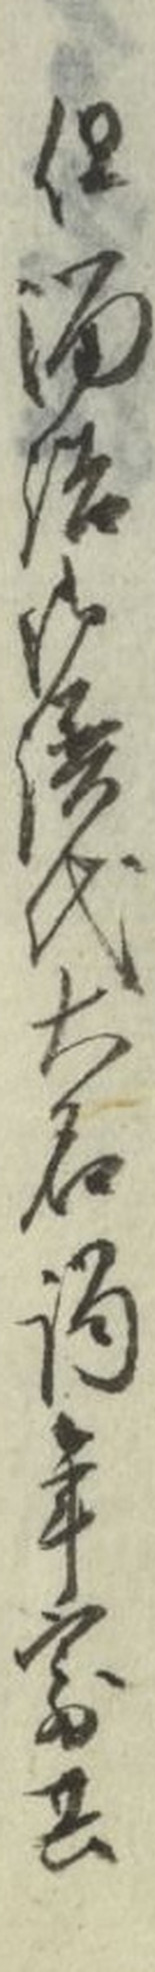但溜詰御譜代大名謁年寄共
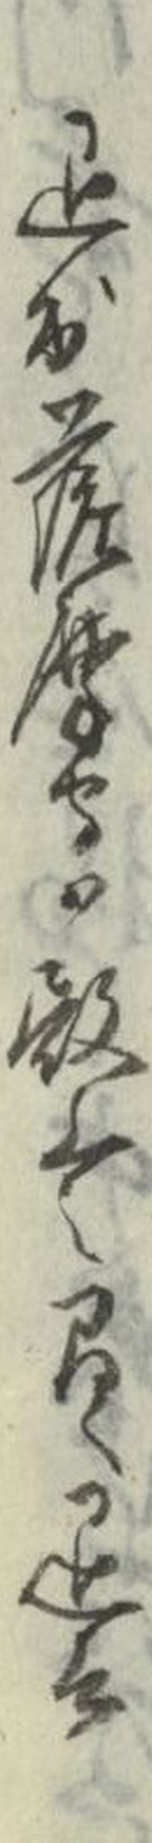退出薩摩守殿上之間へ退去
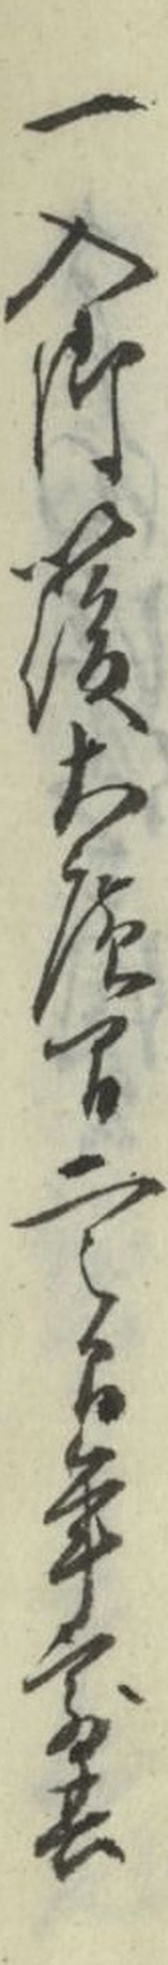一入御以後大広間二之間年寄共
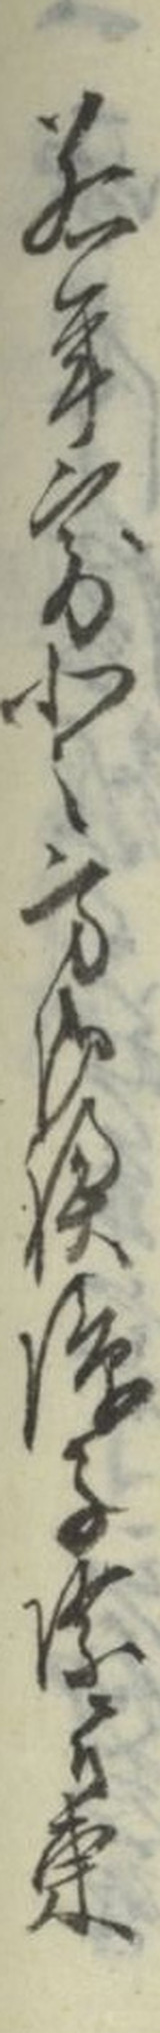若年寄北之方御襖障子際に而東
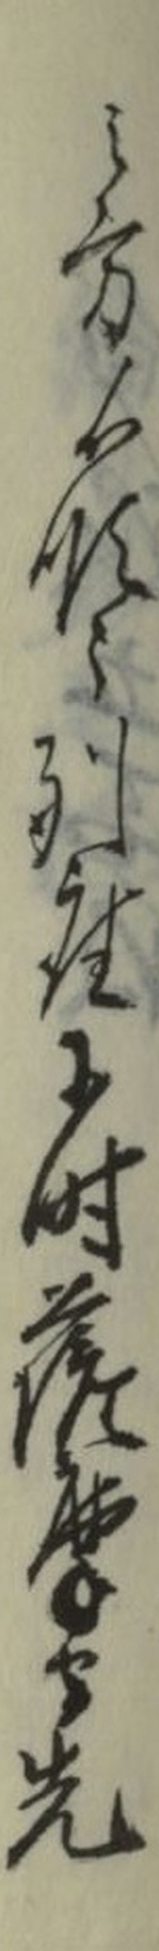之方ゟ順々列座于時薩摩守先
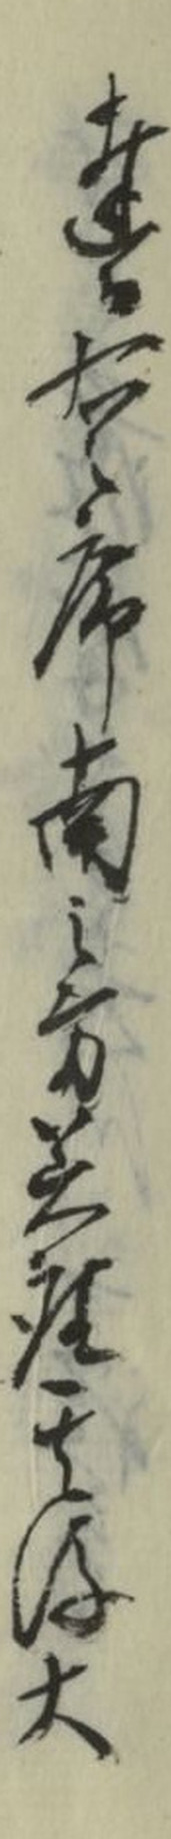達而右之席南之方着座其後大
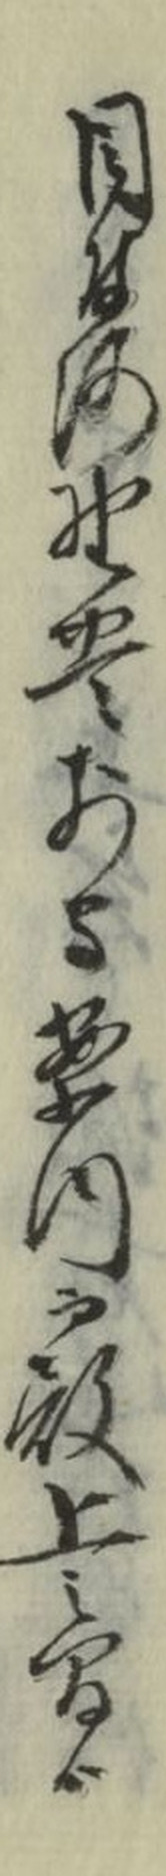目付河野豊前守案内而殿上之間ゟ
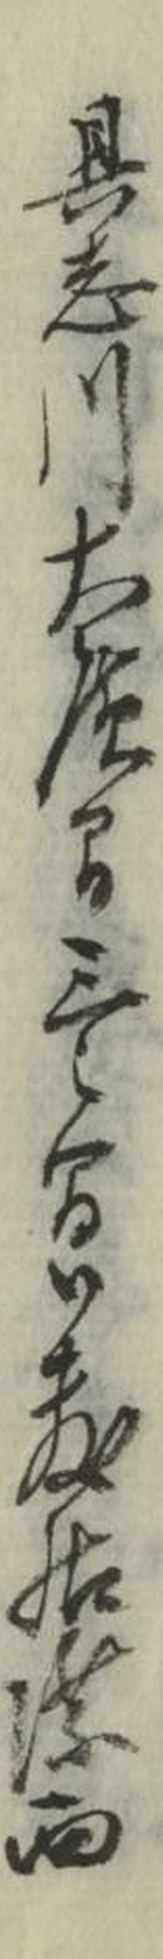具志川大広間三之間御敷居際西
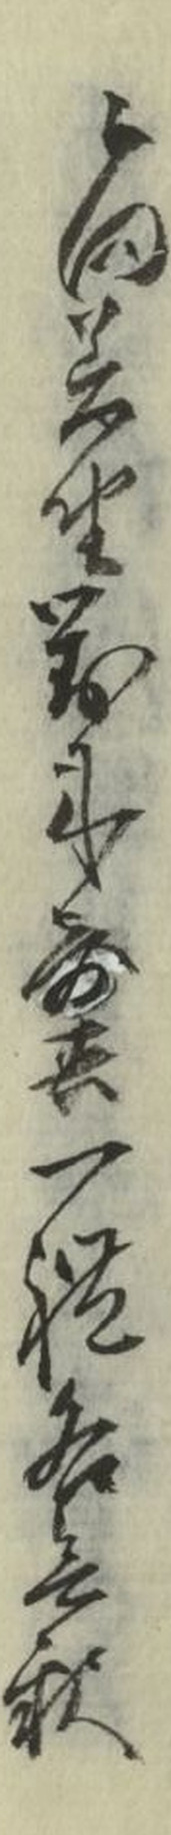に向着坐若年寄共一礼各会釈
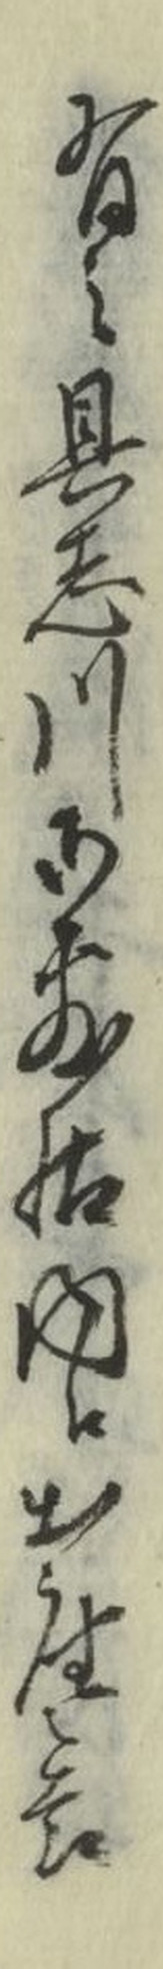有之具志川御敷居内え出座之節
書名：琉球人来朝記 四之五
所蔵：University of the Ryukyus Library
